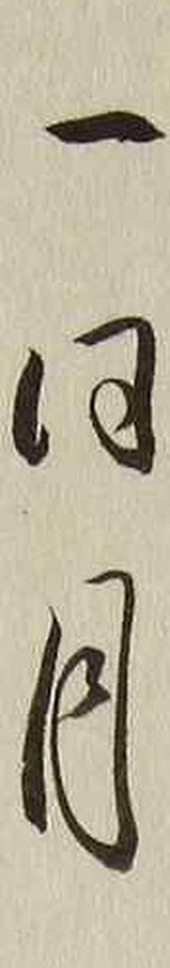一同月
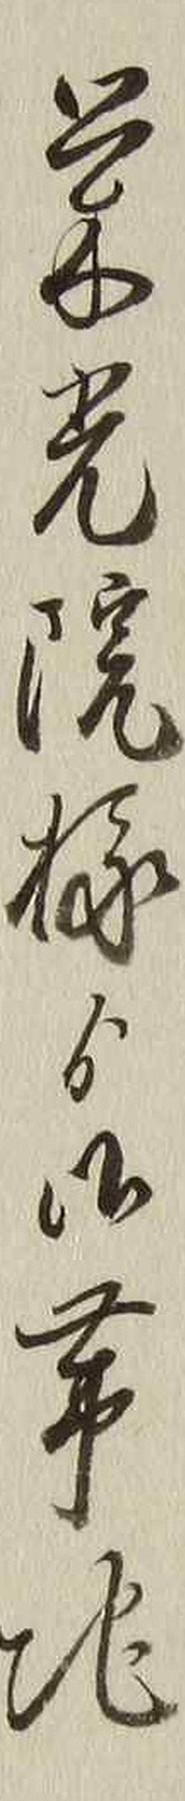栄光院様ゟ御帯地
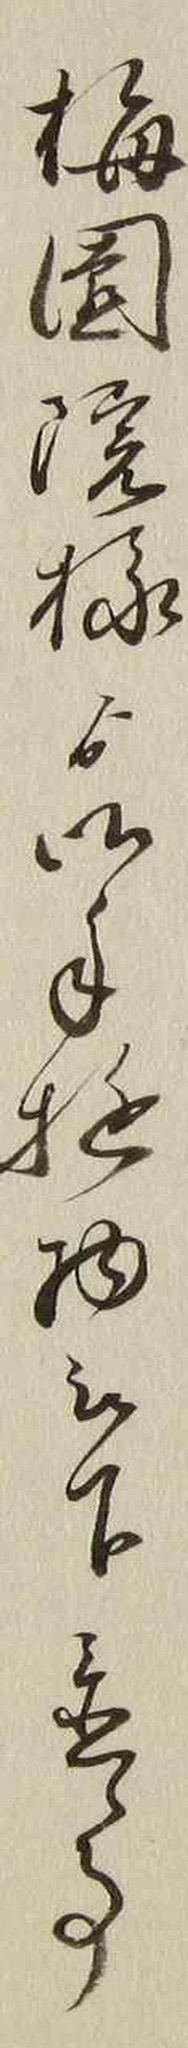梅園院様ゟ御手遊物被下置候事
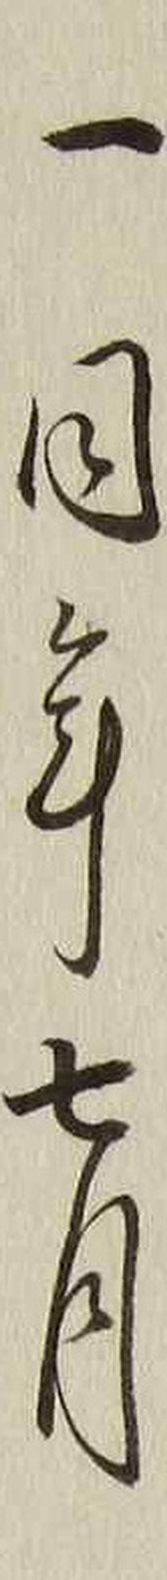一同年七月
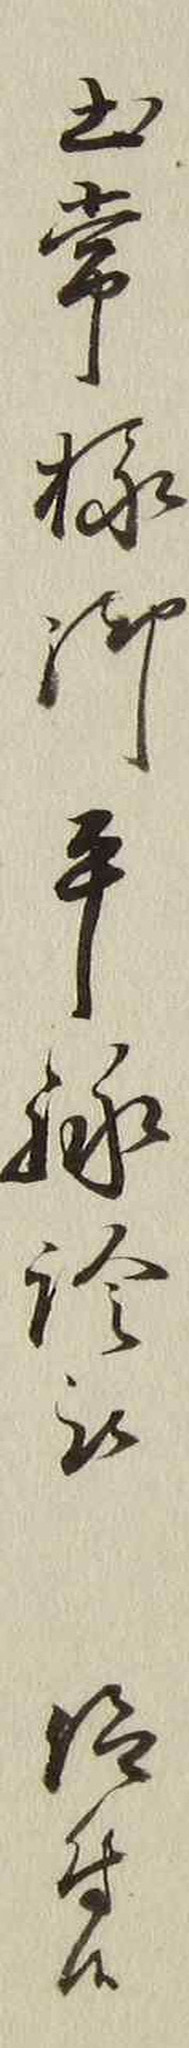土常様御平脈診被仰付候
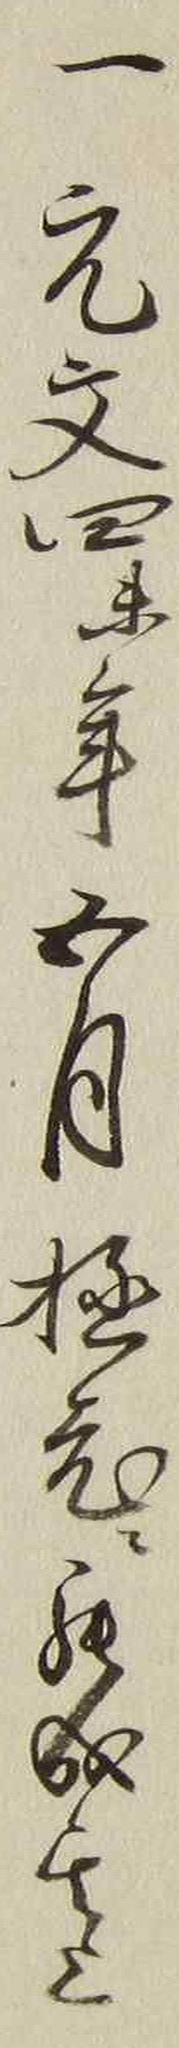一元文四未年五月極老ニ罷成其上
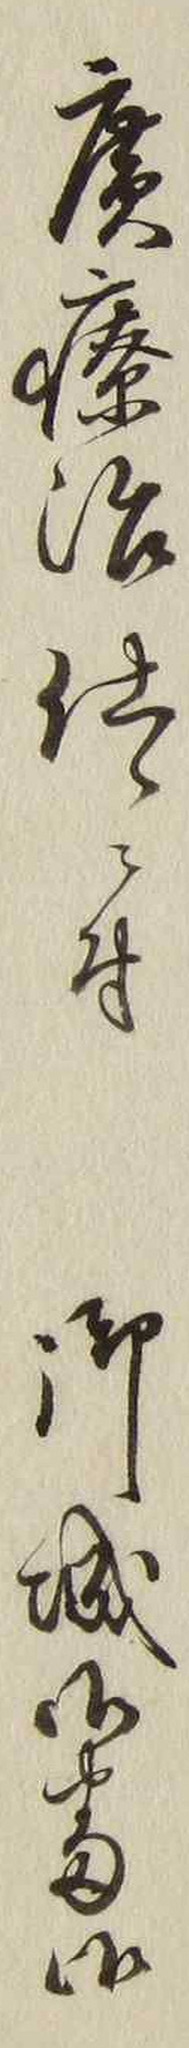広療治仕候ニ付御城御番御

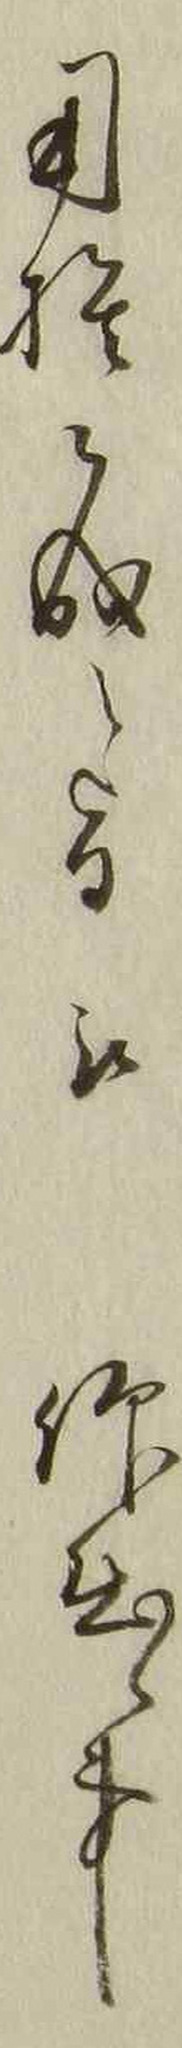用捨ニ成之旨被仰出候事
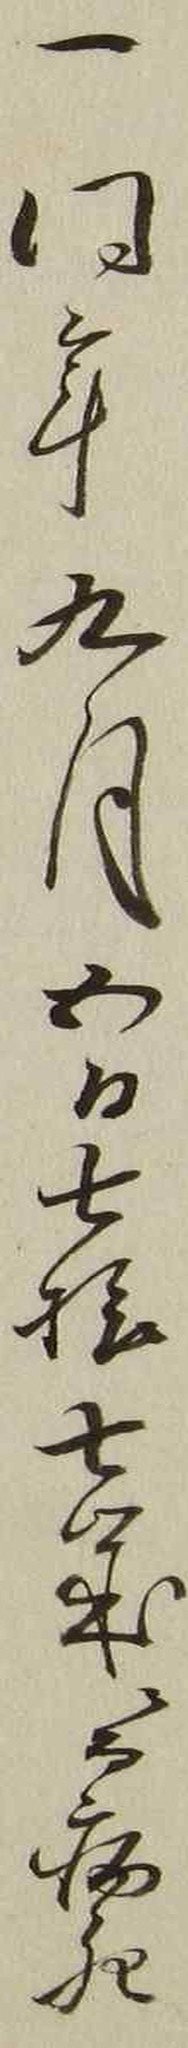一同年九月五日七拾七歳ニ而病死
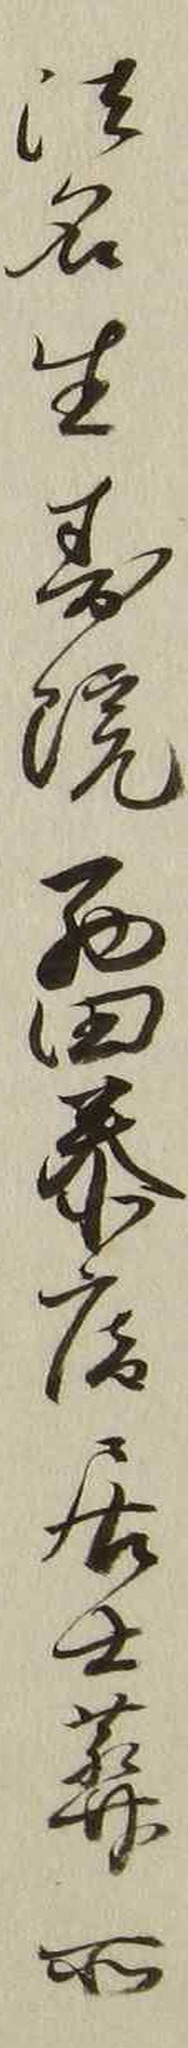法名生寿院西田泰庵居士葬所
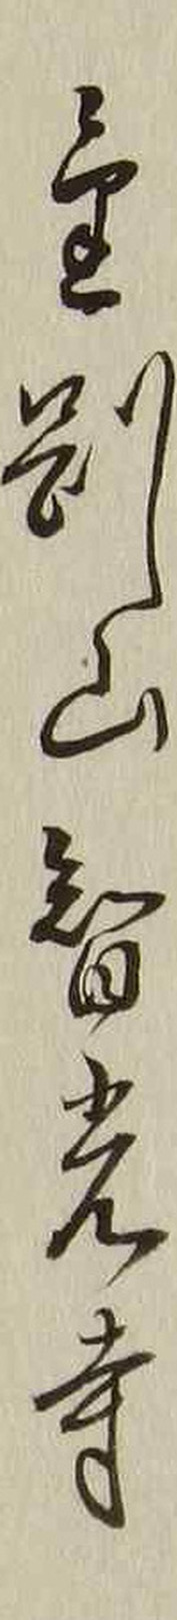金剛山智光寺
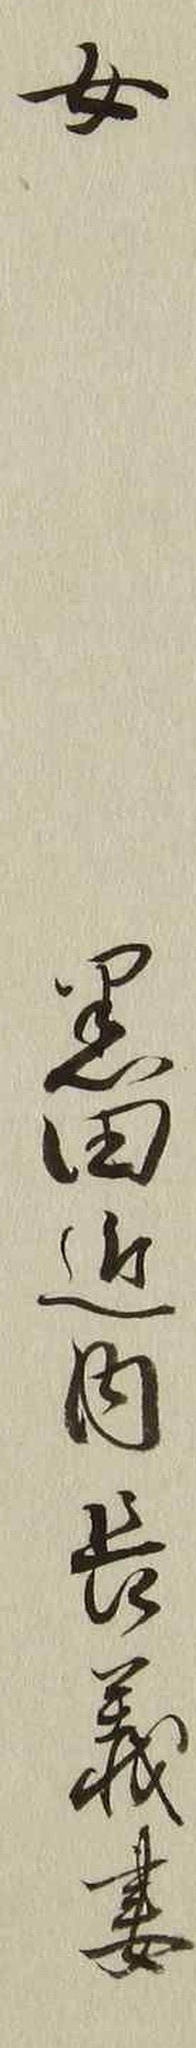女黒田近内長義妻
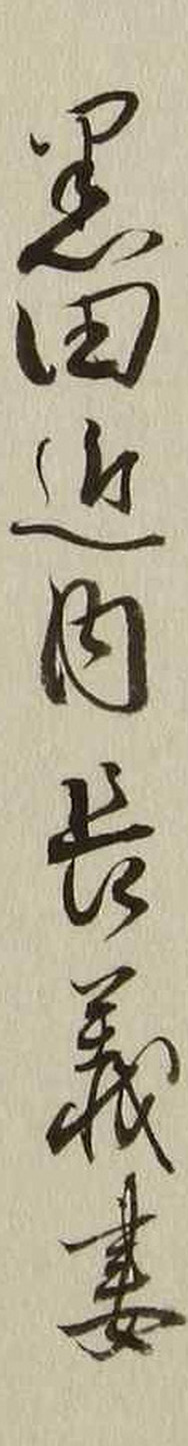女黒田近内長義妻
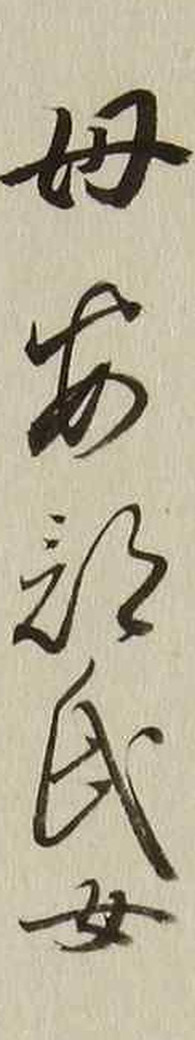母安部氏女
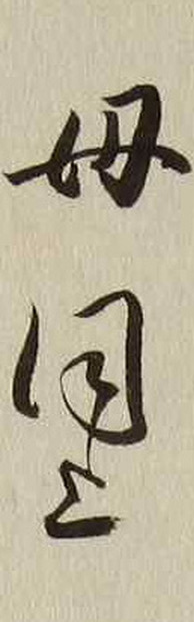母同上
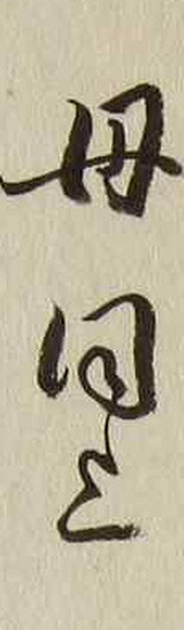母同上
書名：諸士系譜　巻之52　に之部3
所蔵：会津若松市立会津図書館
